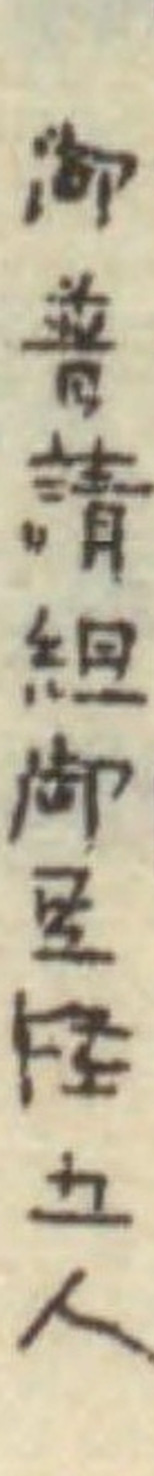御普請組御足軽五人
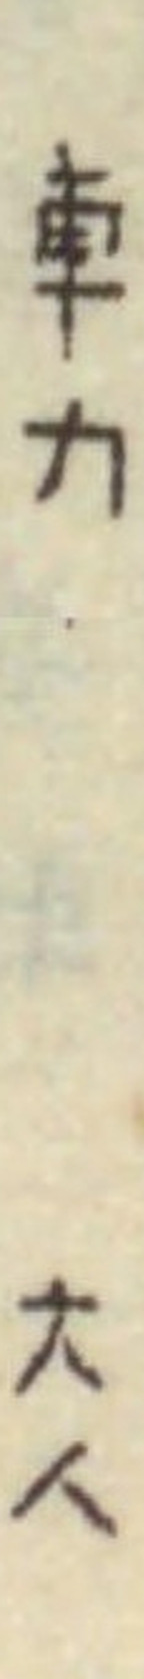車力六人
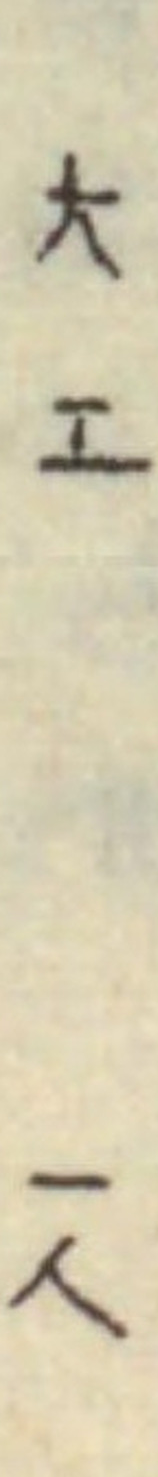大工一人
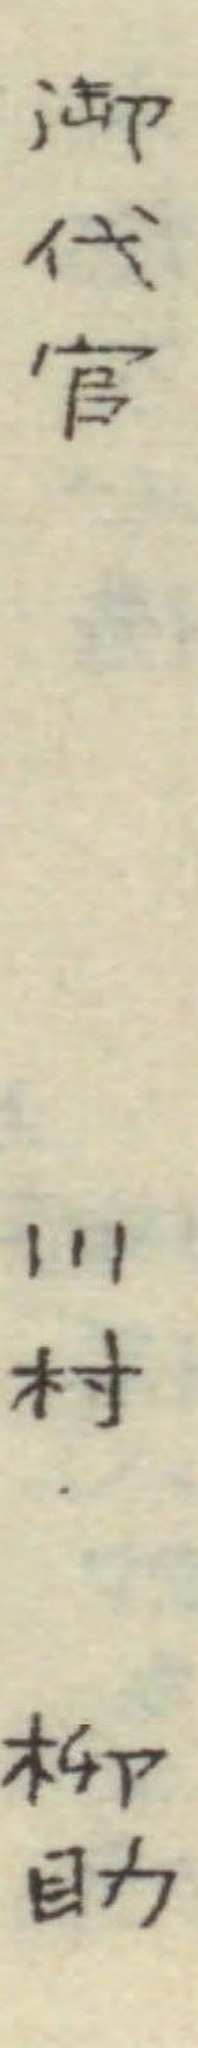御代官川村柳助
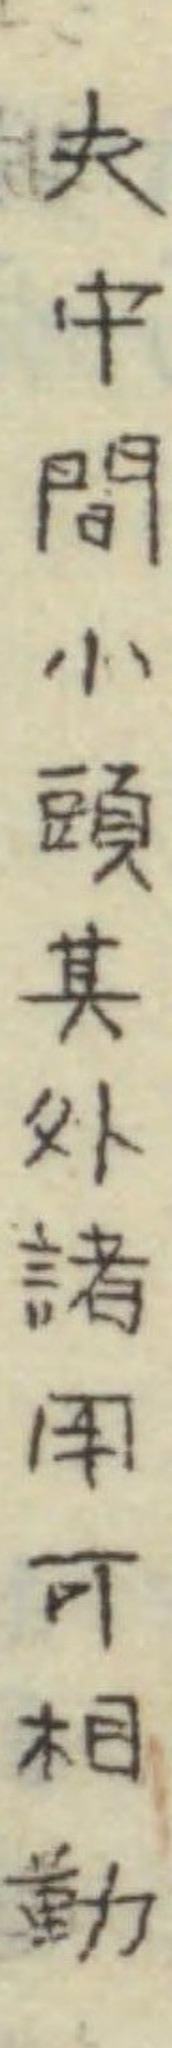夫中間小頭其外諸用可相勤庄屋
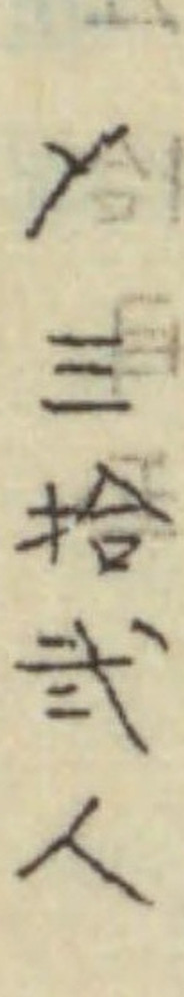〆三拾弐人

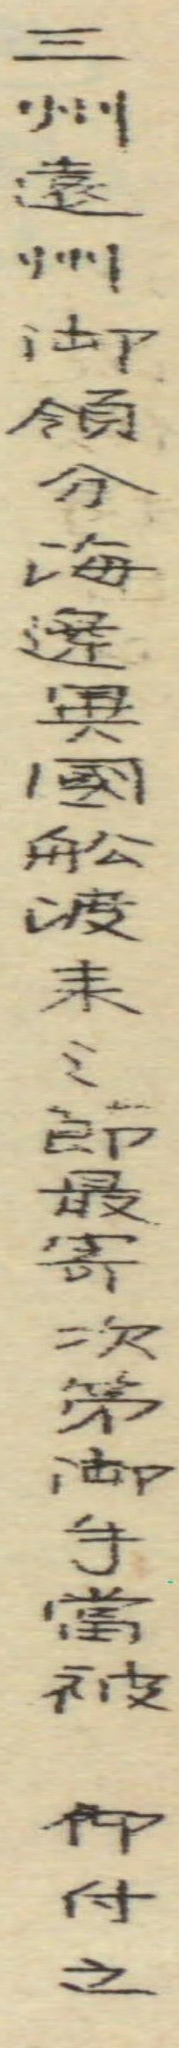三洲遠州御領分海辺異国船渡来之節最寄次第御手当被仰付之
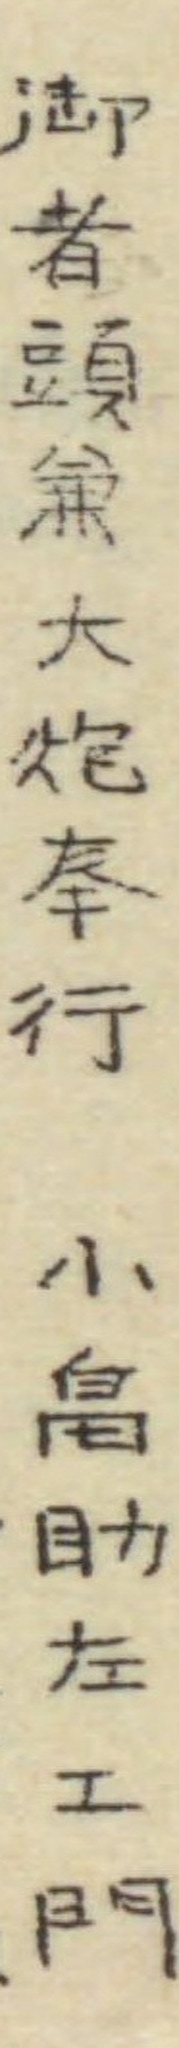騎馬御者頭兼大炮奉行小畠助左エ門
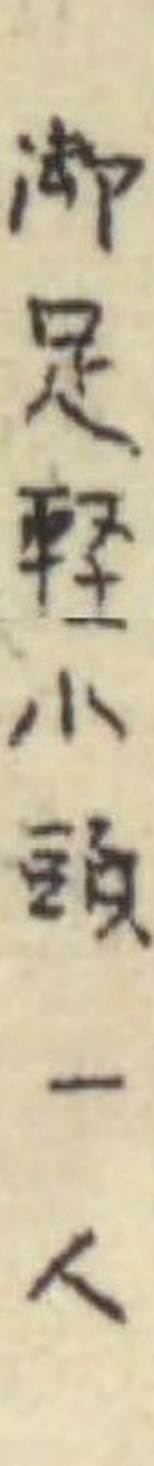御足軽小頭一人
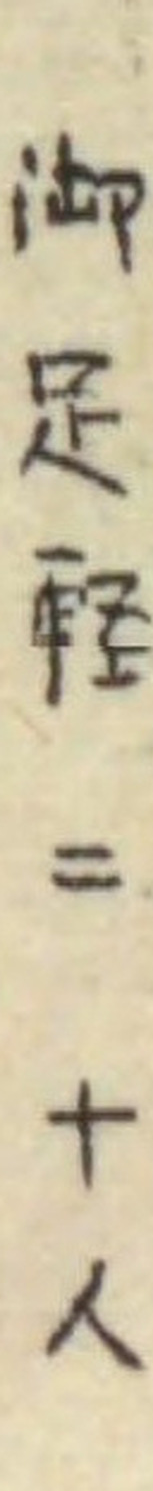御足軽二十人
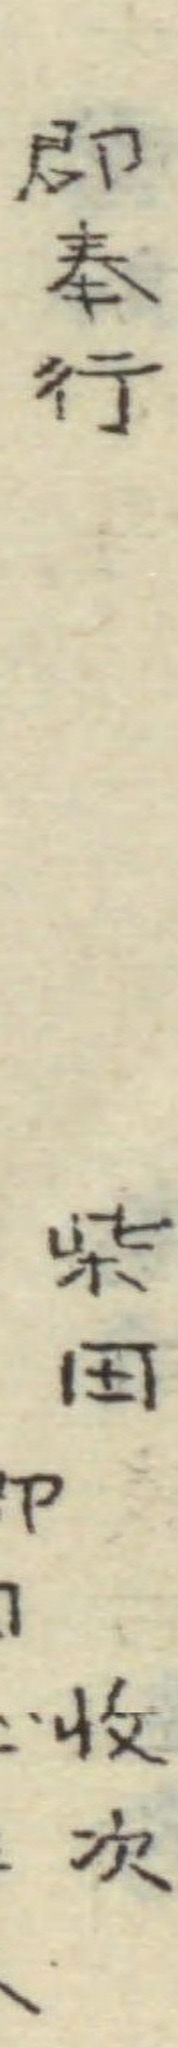騎馬郡奉行柴田収次
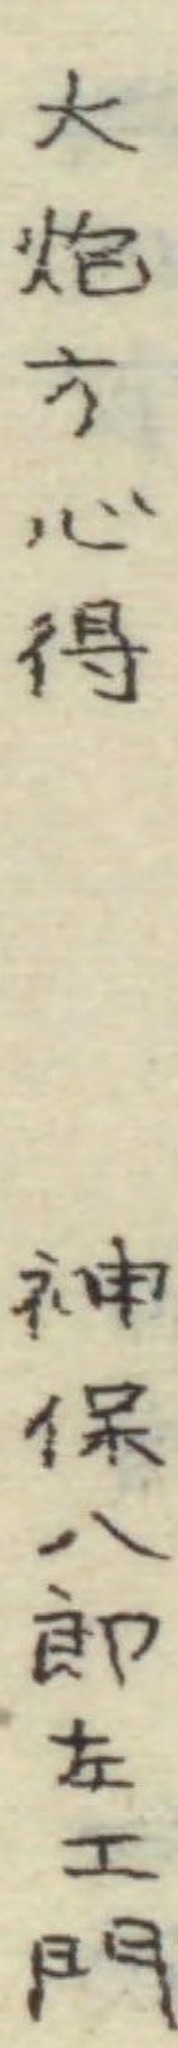大炮方心得神保八郎左エ門
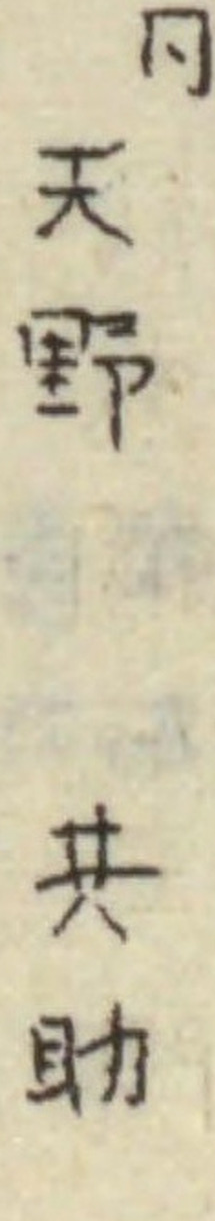天野共助
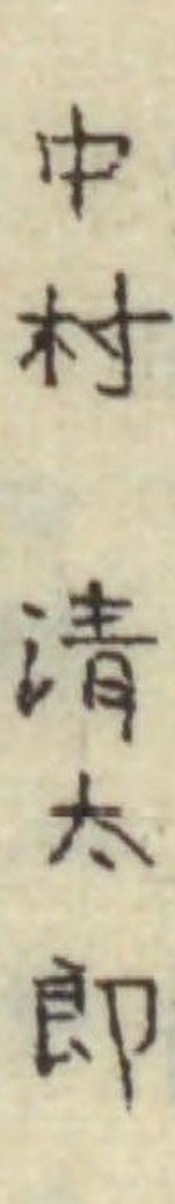中村清太郎
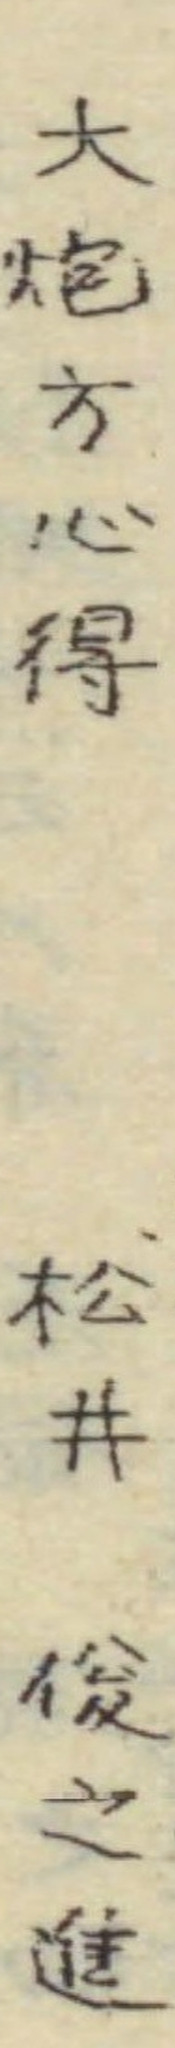大炮方心得松井俊之進
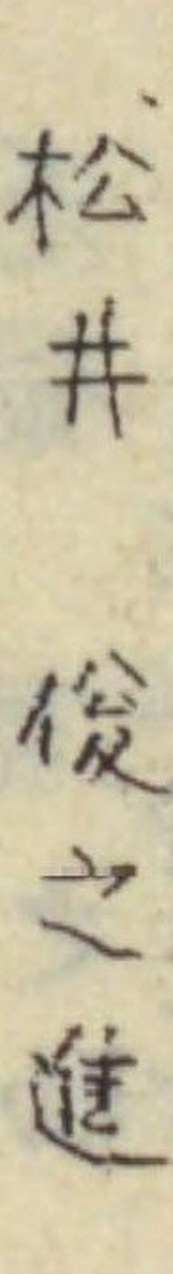松田駒之進
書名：三河吉田藩動員史料
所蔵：国立国会図書館 National Diet Library, JAPAN
